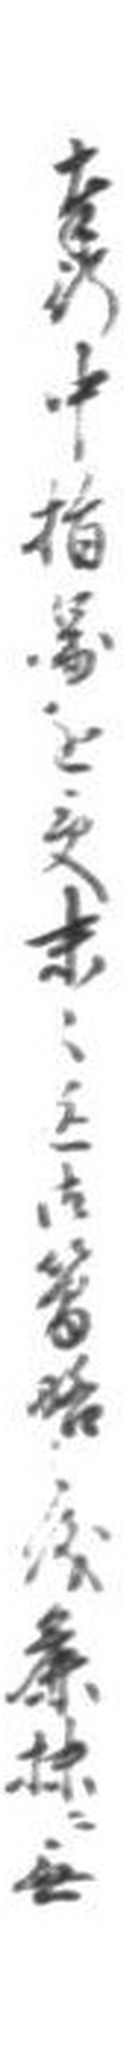奉行中指図を受末々迄御簡略之儀麁抹ニ無

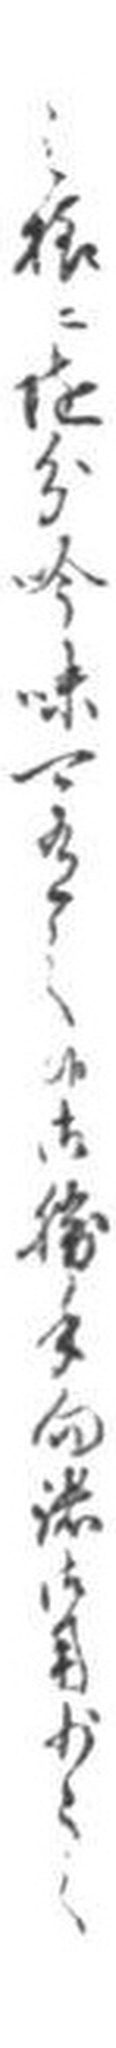之様ニ随分吟味可有之候御勝手向諸御用少々之
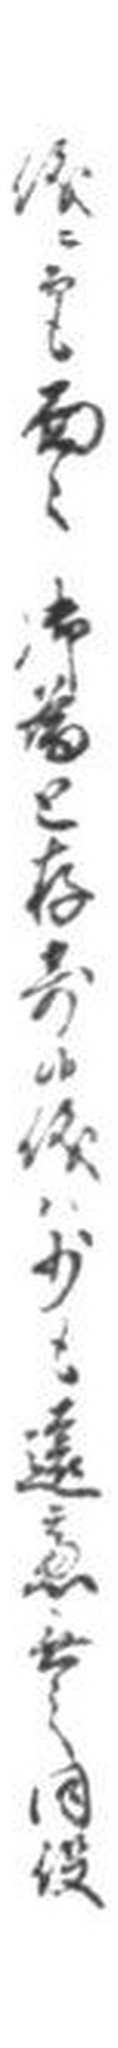儀ニ而も面々御為と存寄候儀ハ少も遠慮無之同役
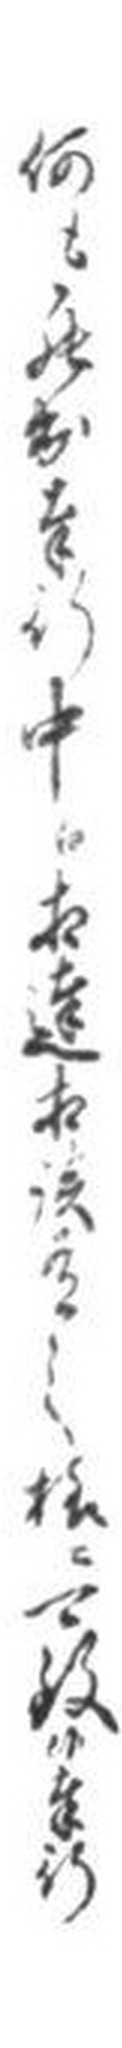何も罷出奉行中江相達相談有之様ニ可致候奉行
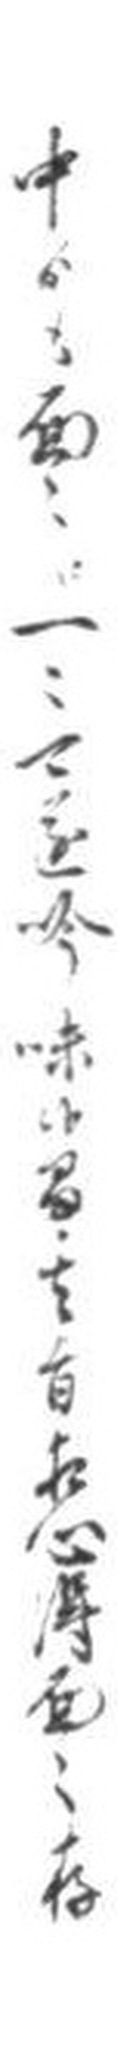中ゟも面々江一々可遂吟味候間其旨相心得面々存
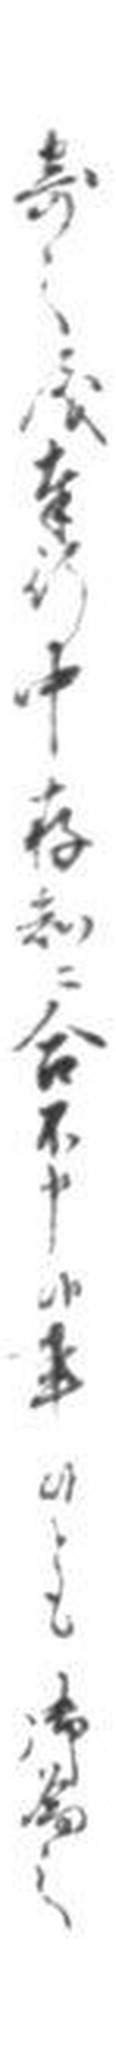寄之儀奉行中存知ニ合不申候事候とも御為之
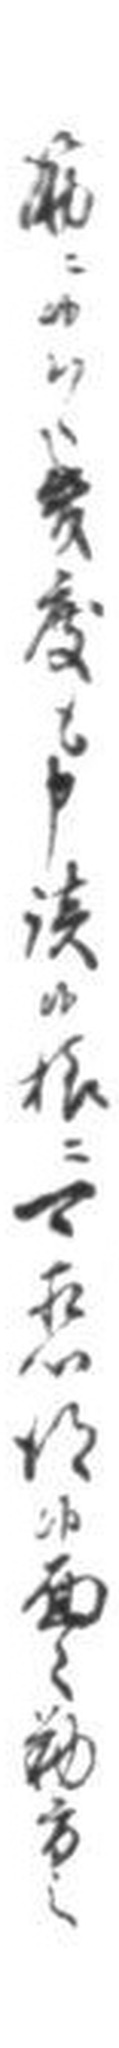筋ニ候ハゝ幾度も申談候様ニ可相心得候面々勤方之
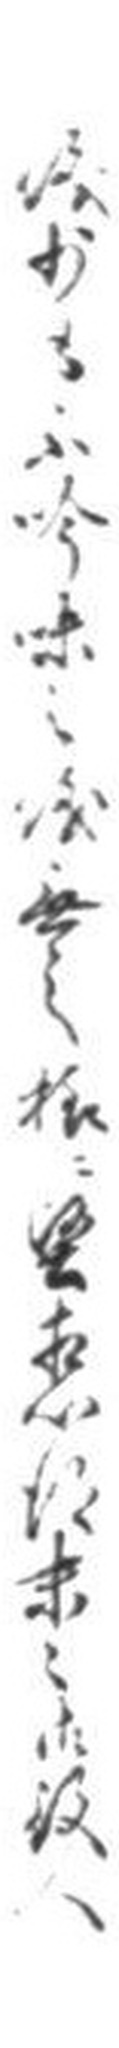儀少も不吟味之儀無之様ニ堅相心得末々御役人
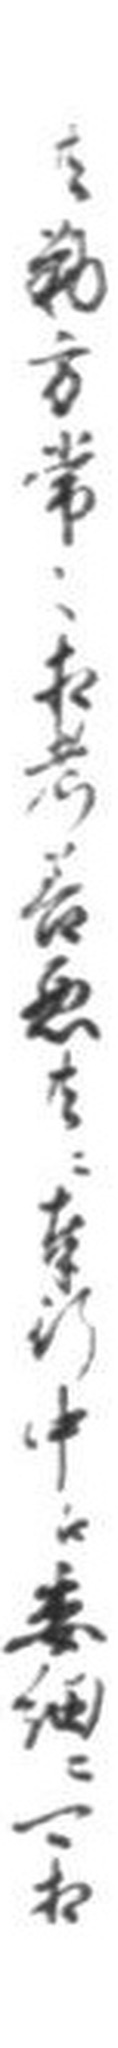共勤方常々相考善悪共ニ奉行中江委細ニ可相
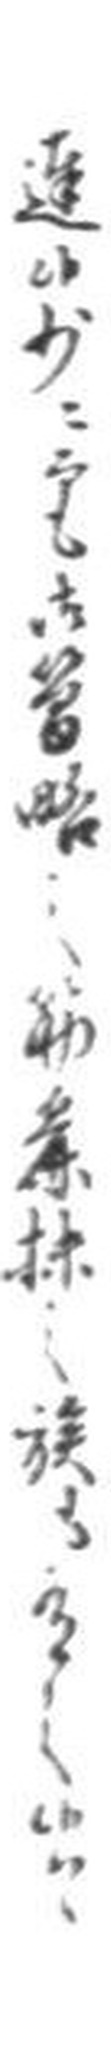達候少ニ而も御簡略之筋麁抹之族も有之候ハゝ
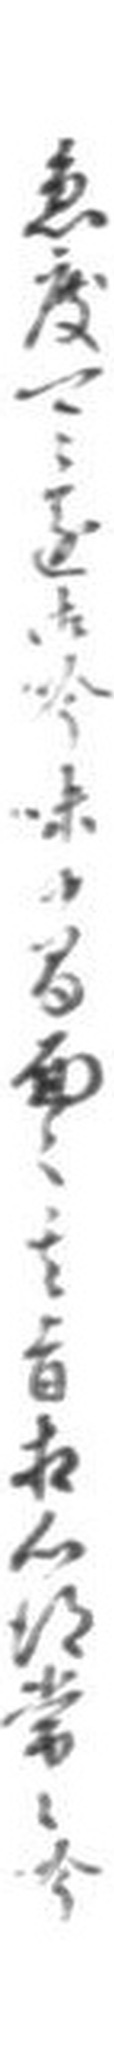急度可被遂御吟味候間面々其旨相心得常々吟
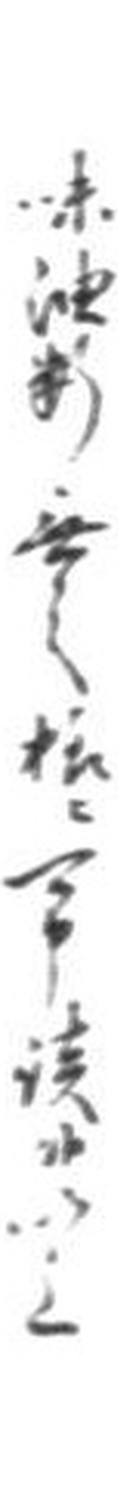味油断無之様ニ可申談候以上
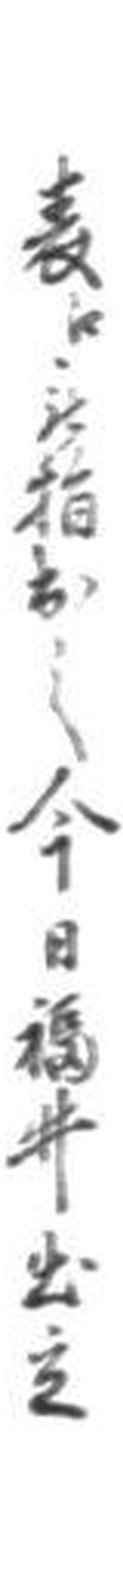表江被指出之今日福井出立
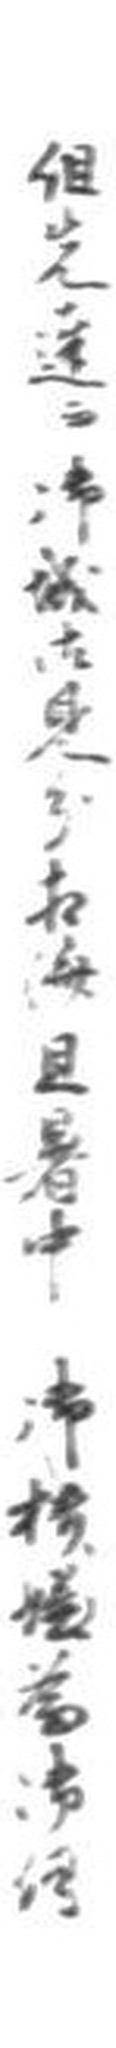但先達而御城御見分相済且暑中御機嫌為御伺
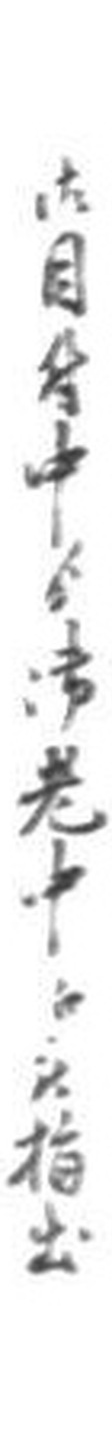御目付中ゟ御老中江被指出
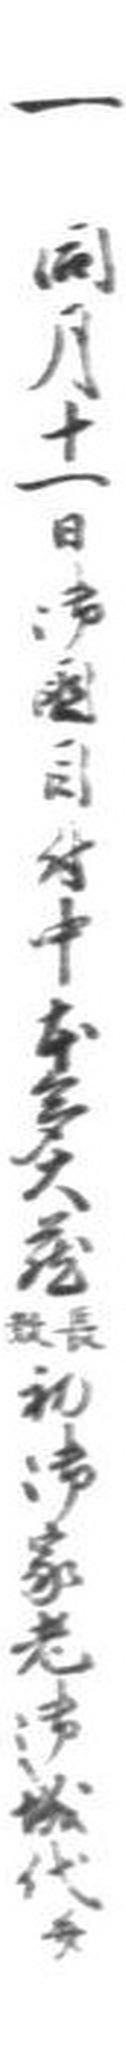一同月十一日御国目付中本多大蔵長教初御家老御城代并
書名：家譜 三十九 宗矩公 享保十年
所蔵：福井県文書館 Fukui Prefectural Archives
